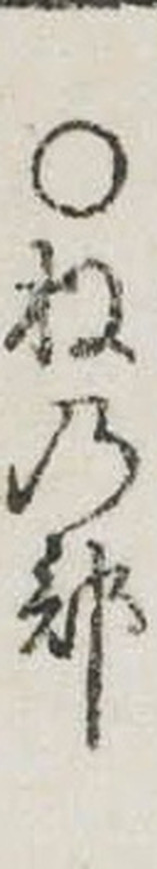○れの部
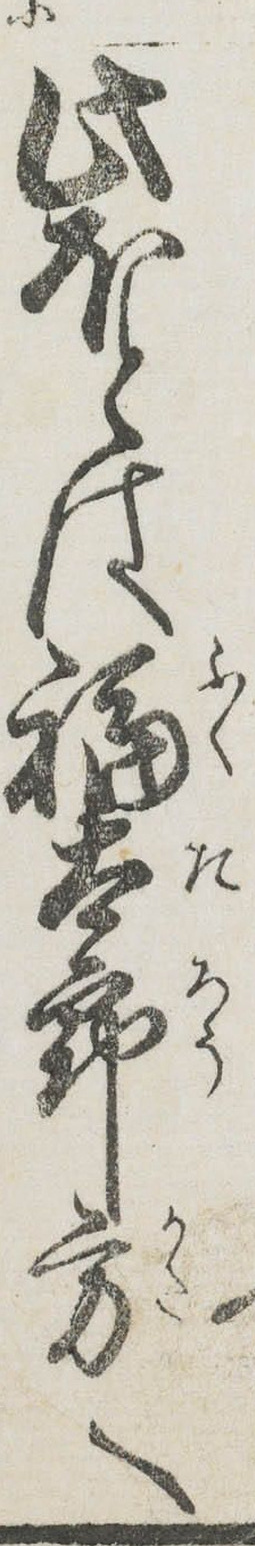此ほとは福太郎方へ
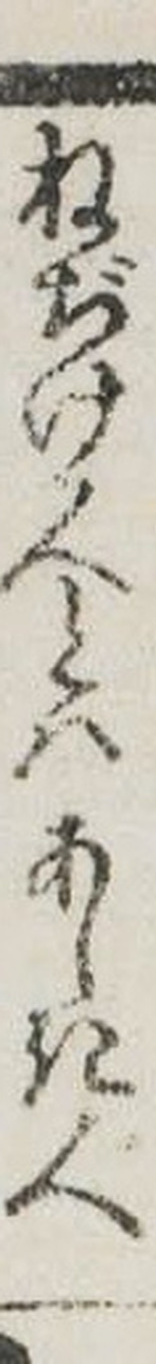ねぢけ人とはあしき人
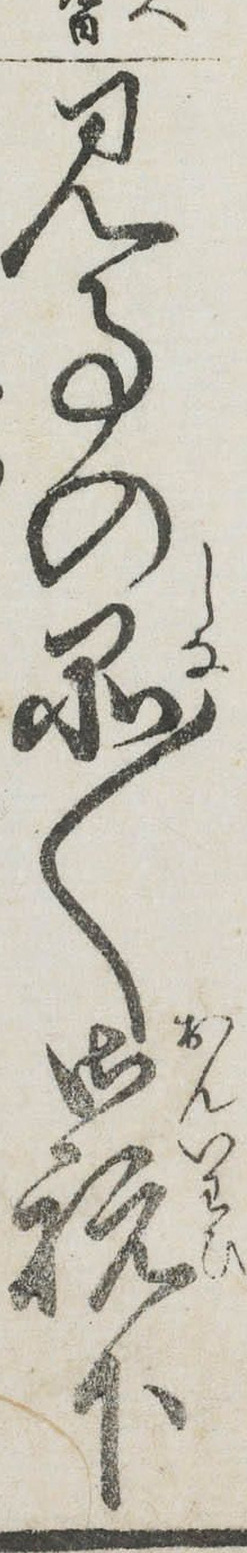見事の品〳〵御祝下
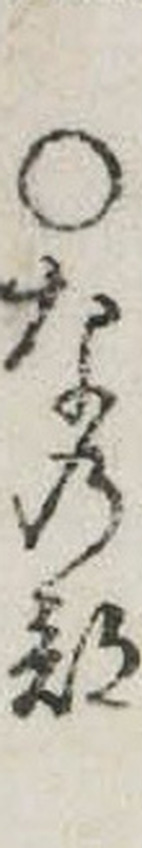○なの部
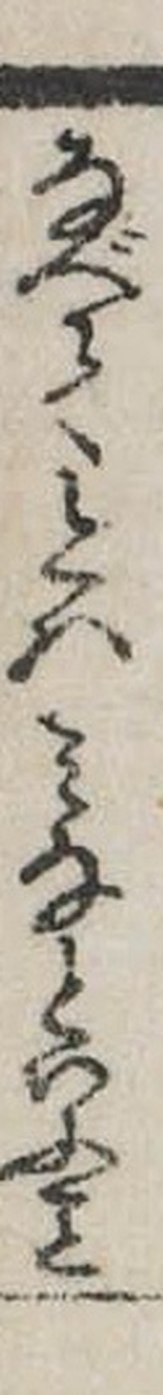なべてとはみなといふこと

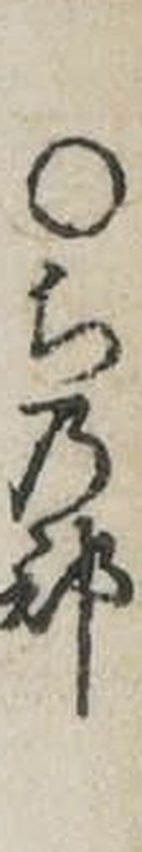○らの部
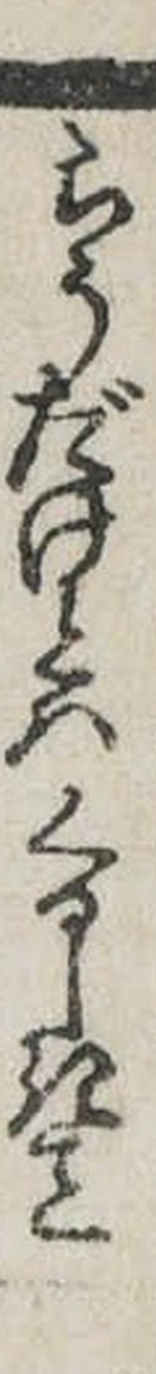らうだけとはくるしきこと
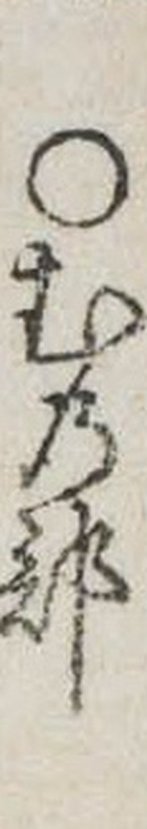○むの部
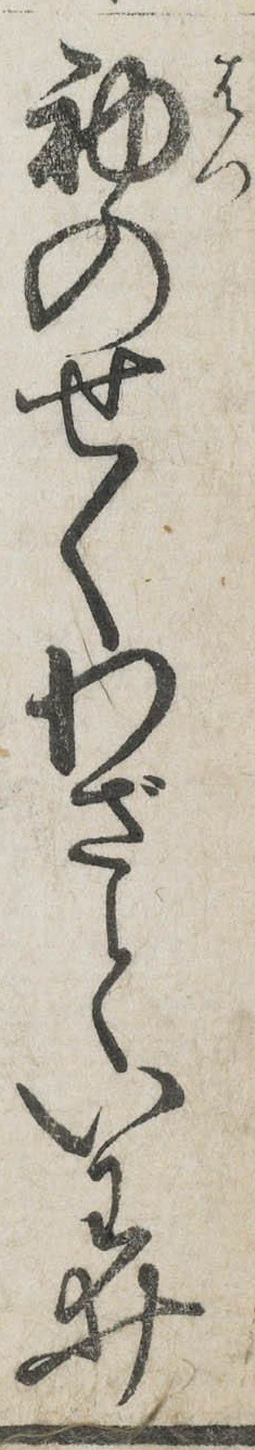初のせくわざといわい
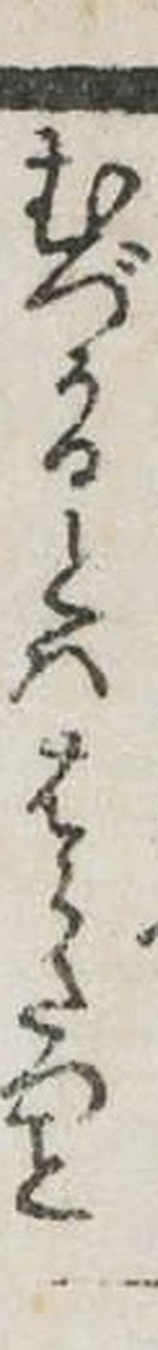むづかるとははらたつこと
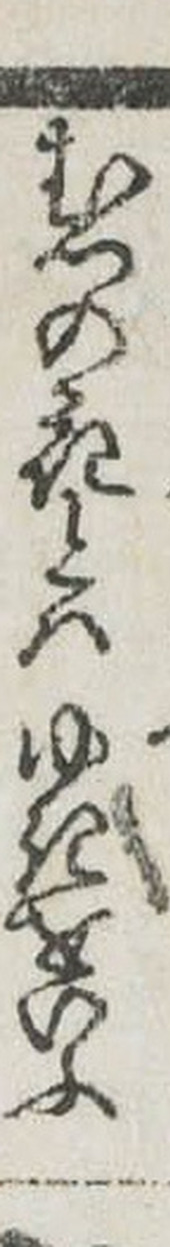むつの花とはゆきをいふ
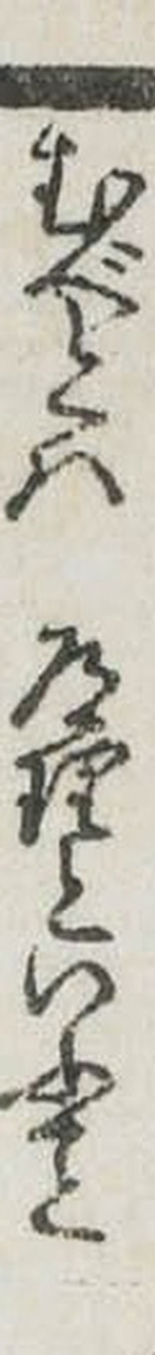むべとは道理といふこと
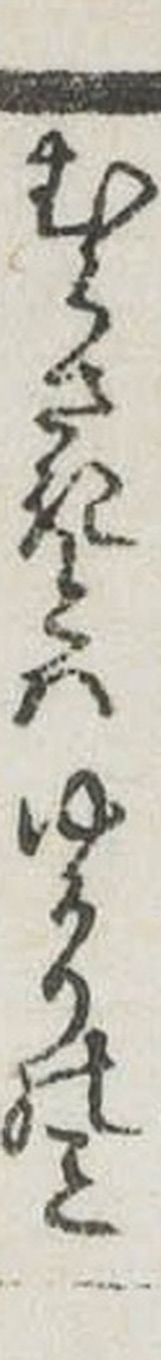むらさきとはゆかりのこと
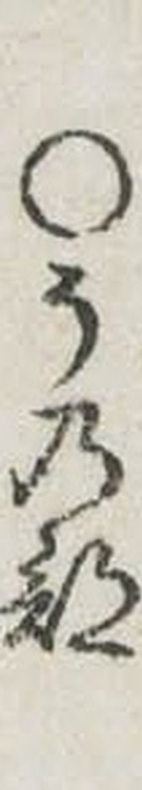○らの部
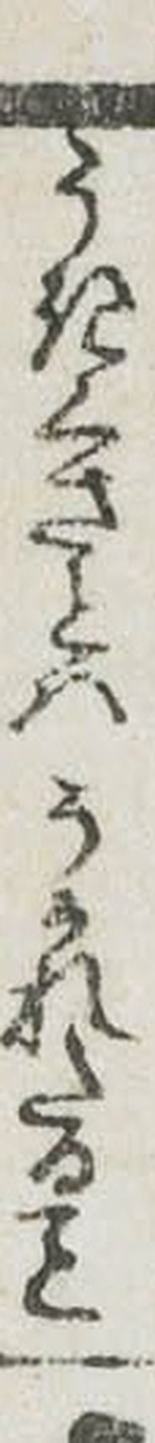うきくさとはうかれたること
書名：頭書萬用婦人手紙之文言
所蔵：東京学芸大学教育コンテンツアーカイブ
